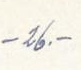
26
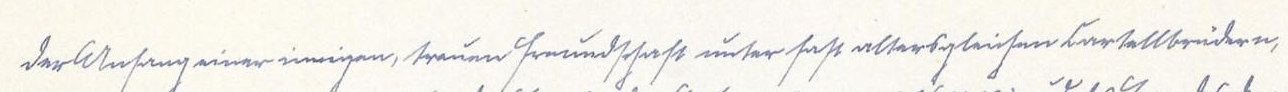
der Anfang einer innigen, treuen Freundschaft unter fast altersgleichen Cartellbrüdern,
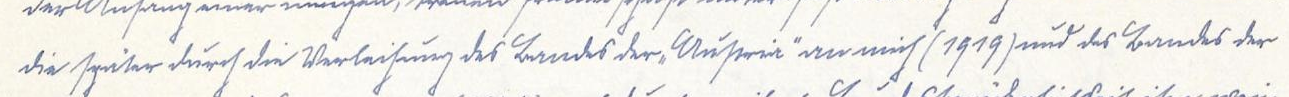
die später durch die Verleihung des Bandes der „Austria“ an mich (1919) und des Bandes der
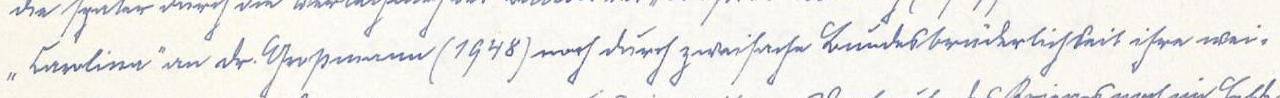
„Carolina“ an Dr. Großmann (1948) noch durch zweifache Bundesbrüderlichkeit ihre wei-
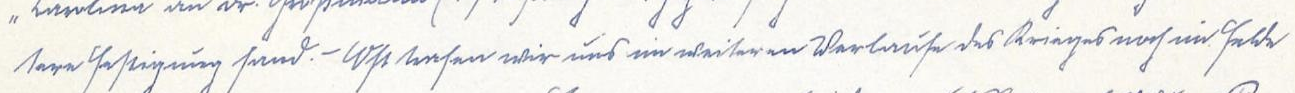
tere Festigung fand. - Oft trafen wir uns im weiteren Verlauf des Krieges noch im Felde
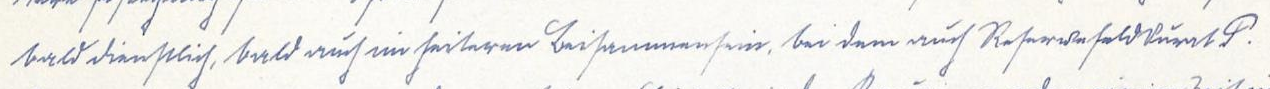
bald dienstlich bald auch in heiterem Beisammensein, bei dem auch Reservefeldkurat P.
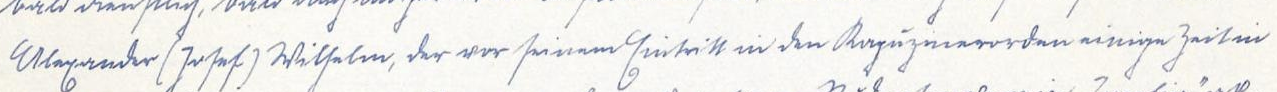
Alexander (Josef) Wilhelm, der von seinem Eintritt in den Kapuzinerordern einige Zeit in
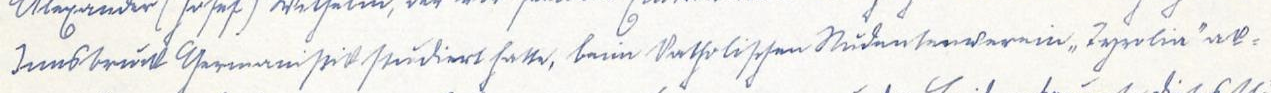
Innsbruck Germanistik studiert hatte, beim katholischen Studentenverein „Tyrolia“ ak-
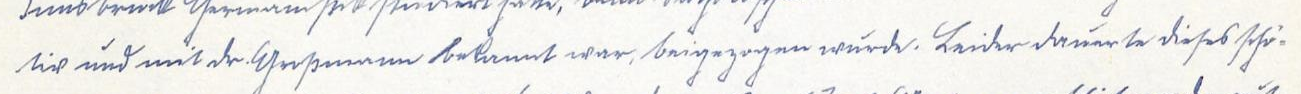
tiv und mit Dr. Großmann bekannt war, beigezogen wurde. Leider dauerte dieses schö-
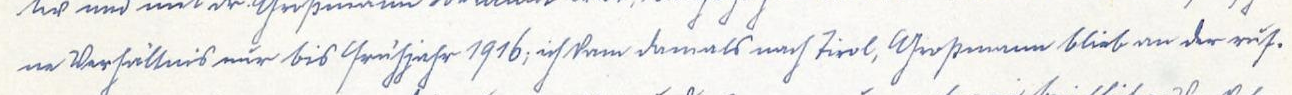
ne Verhältnis nur bis Frühjahr 1916; ich kam damals nach Tirol,Großmann blieb an der rus-
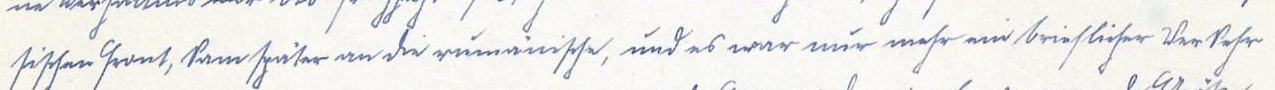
sischen Front, kam später an die rumänische, und es war nur mehr ein brieflicher Verkehr
